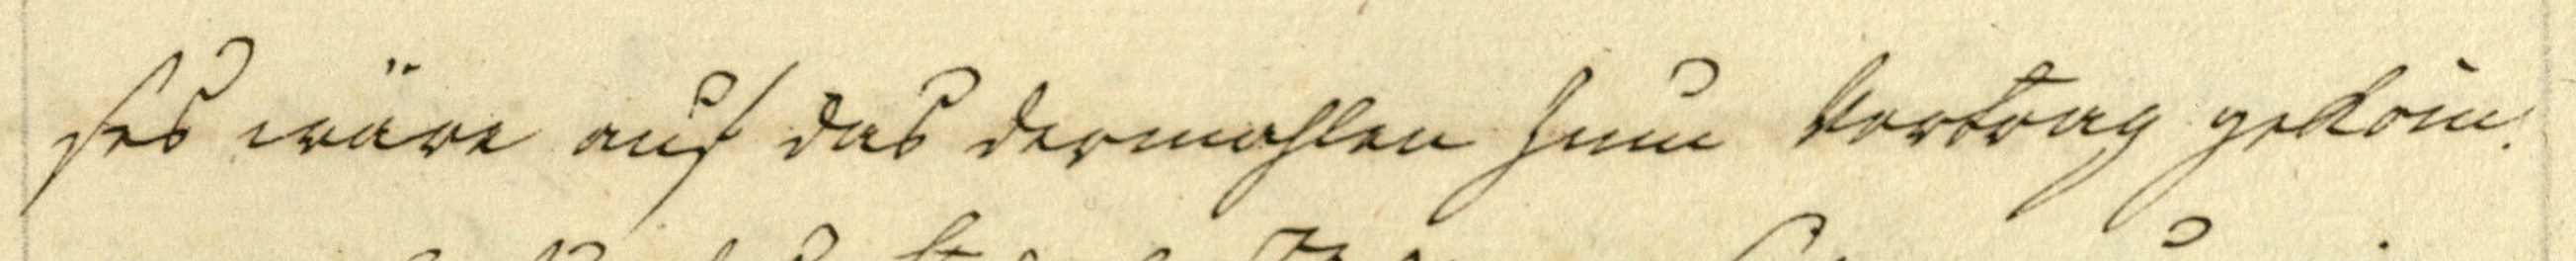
ses wäre auf das dermahlen zum Vortrag gekom¬
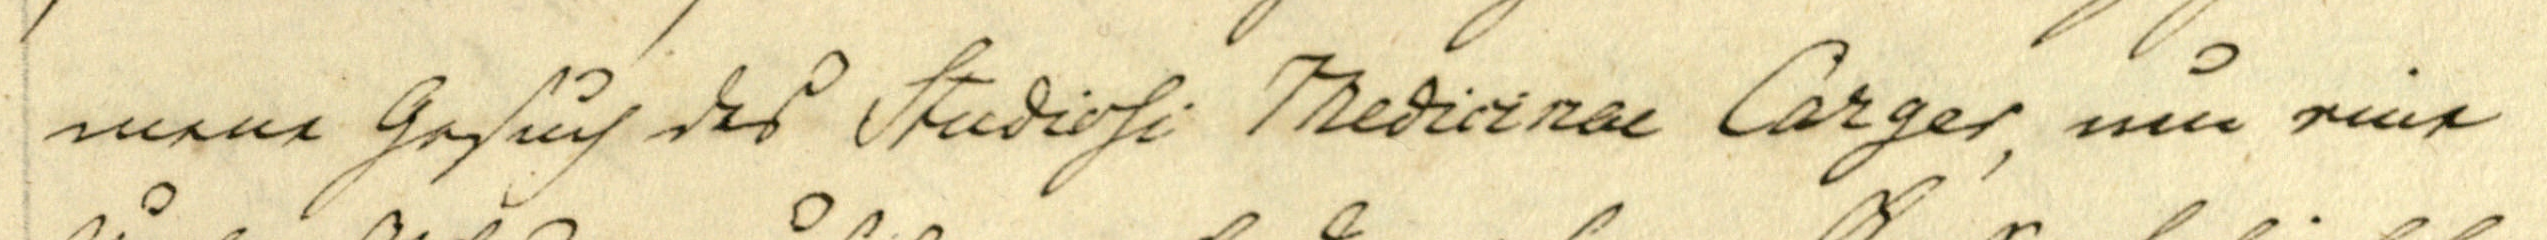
mene Gesuch des Studiosi Medicinae Carger, um eine
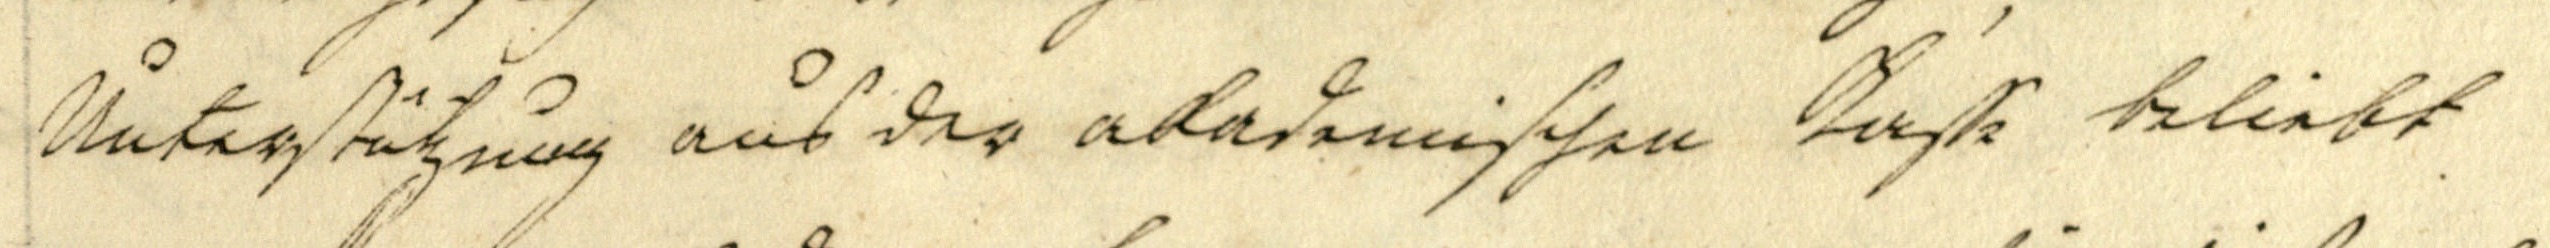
Unterstützung aus der akademischen Kasse beliebt
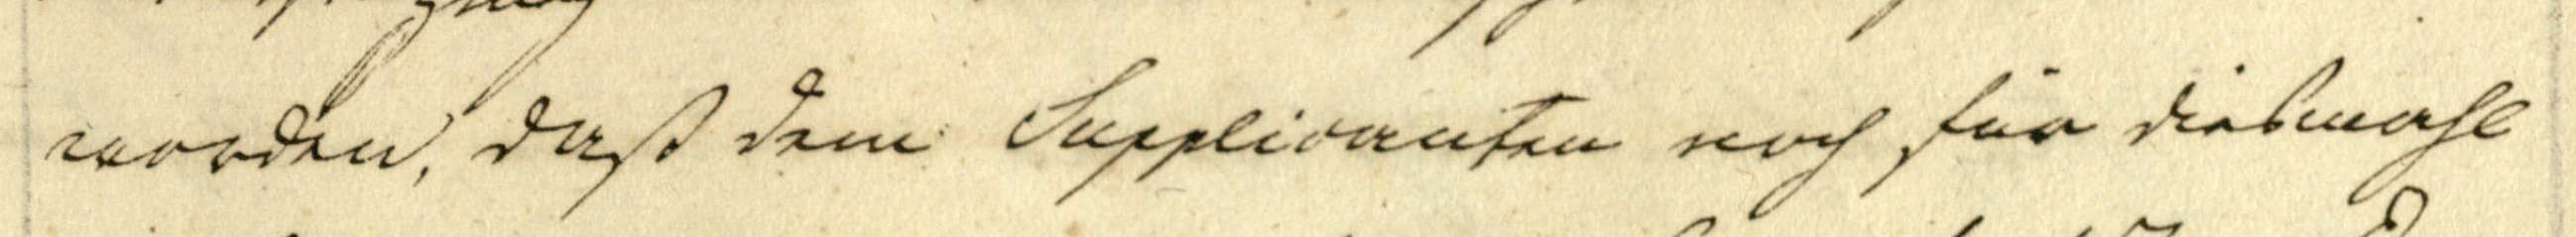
worden, daß dem Supplicanten noch für diesmahl
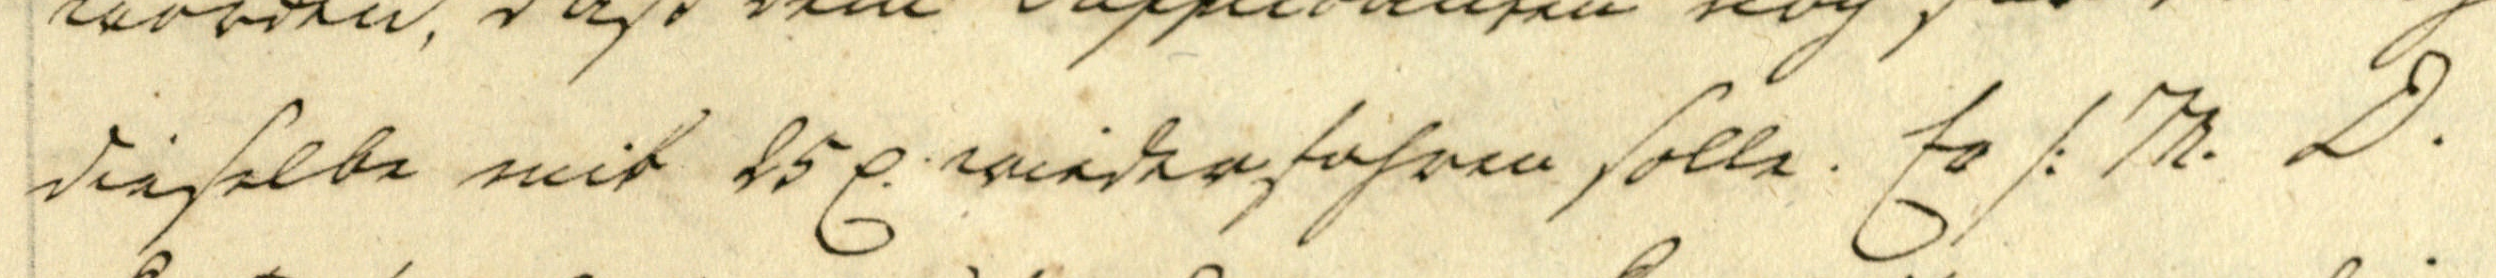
dieselbe mit 25 l. wiederfahren solle. Er /: M. D.
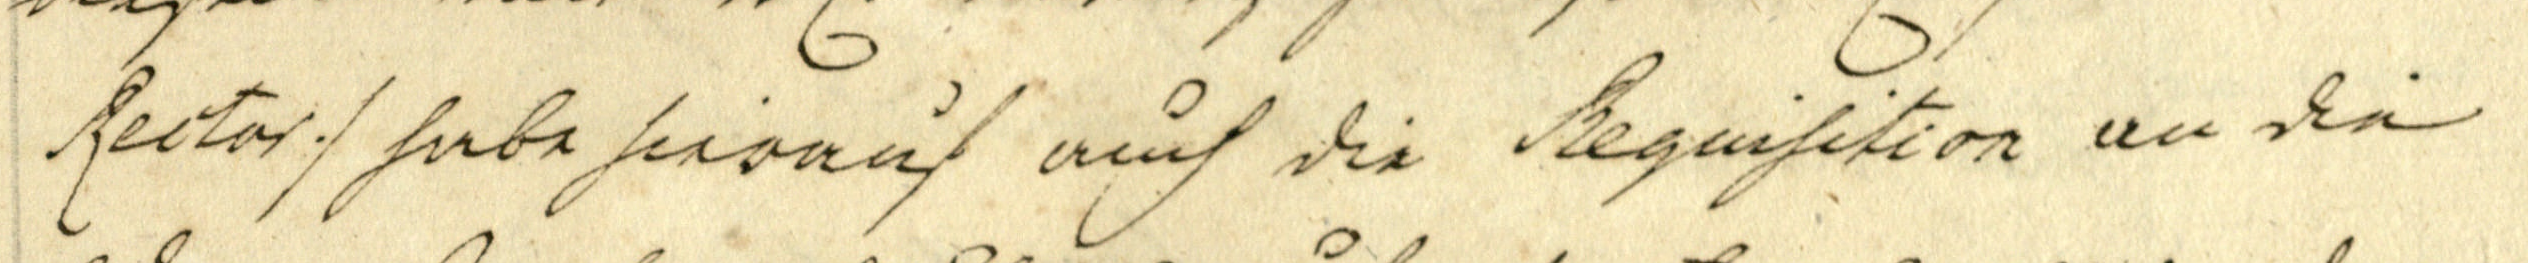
Rector ./ habe hierauf auch die Requisition an die
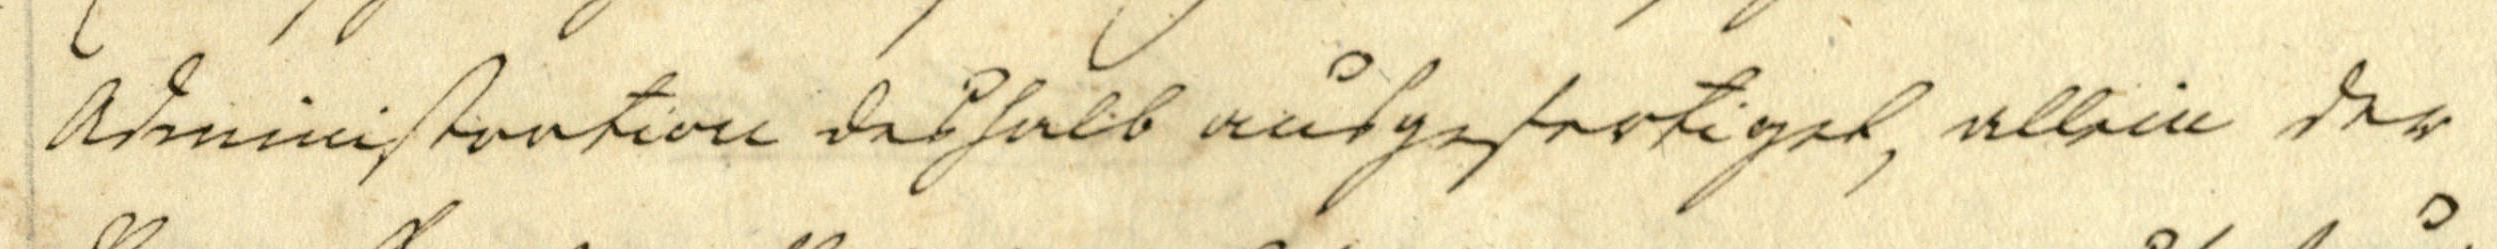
Administration deshalb ausgefertiget, allein der
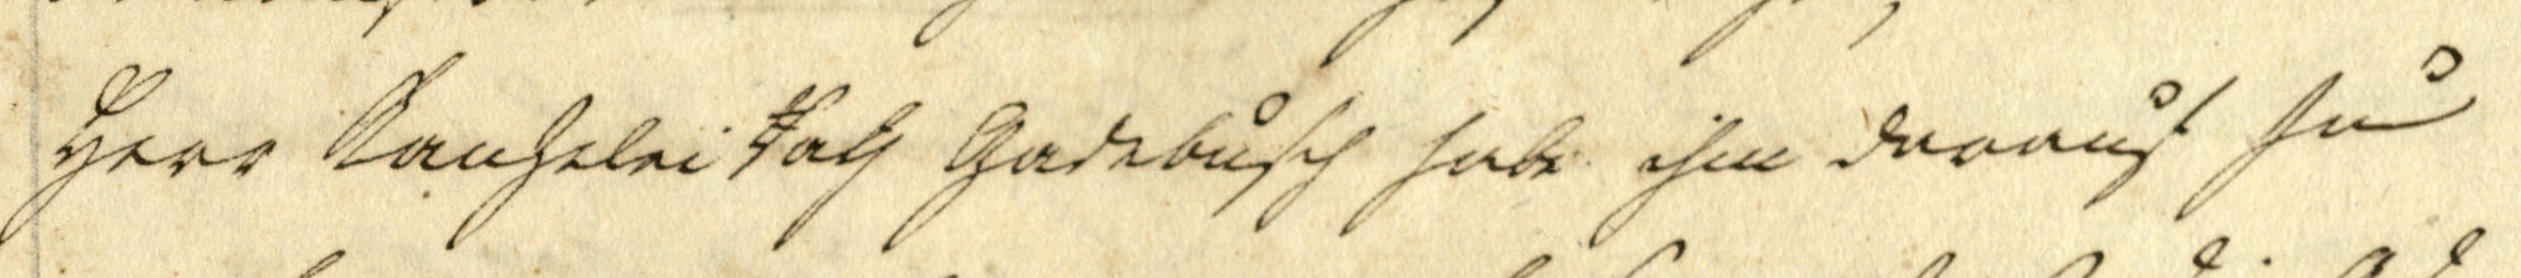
Herr Kanzelei Rath Gadebusch habe ihm darauf zu
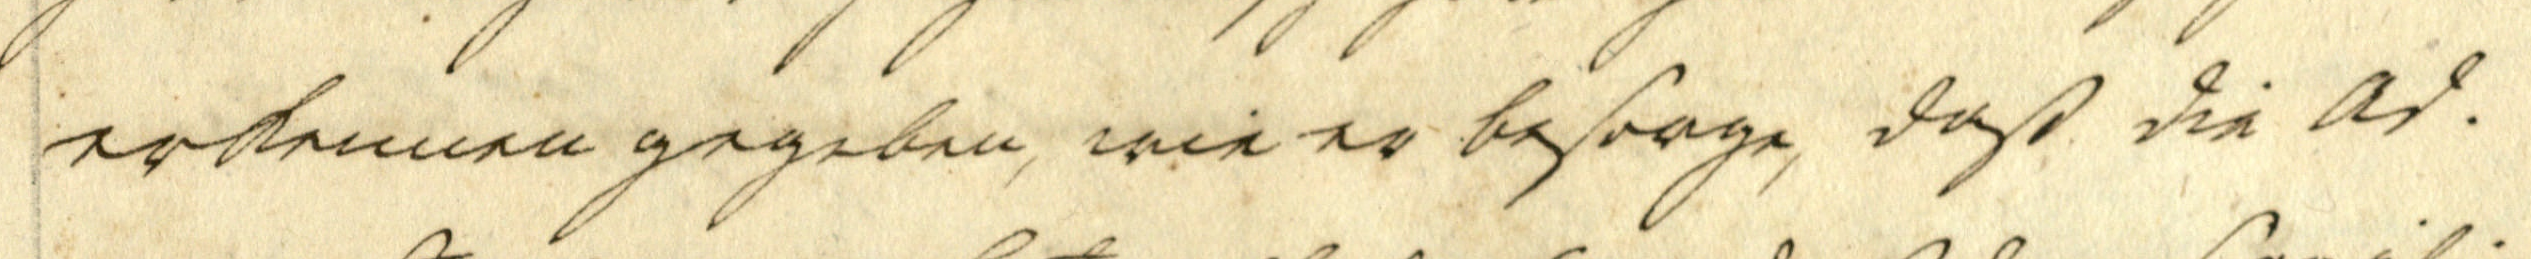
erkennen gegeben, wie er besorge, daß die Ad¬
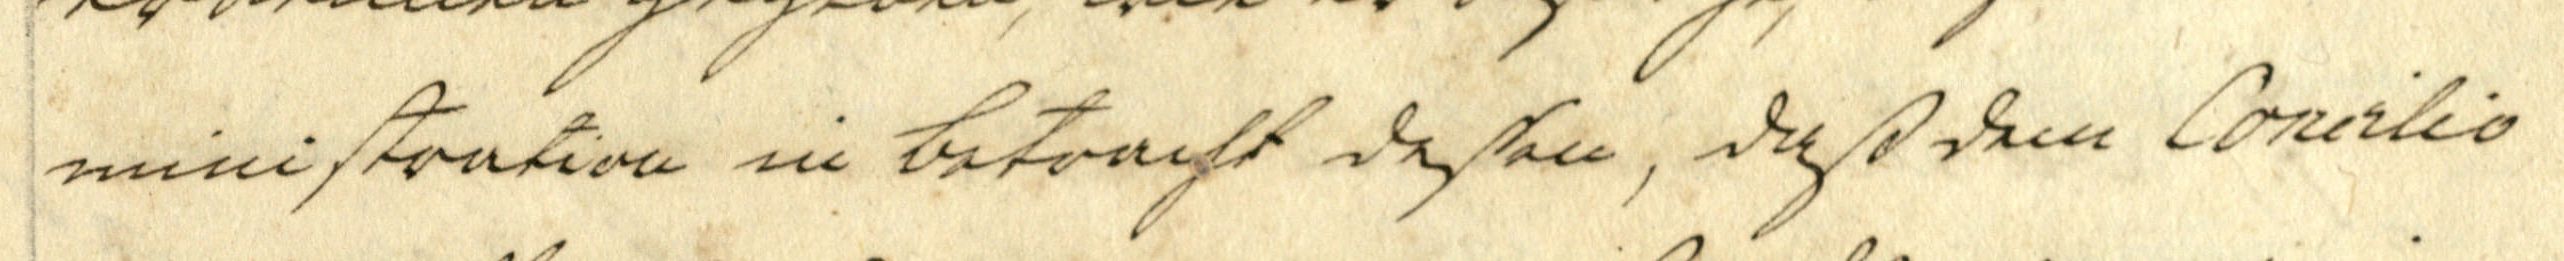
ministration in Betracht dessen, daß dem Concilio
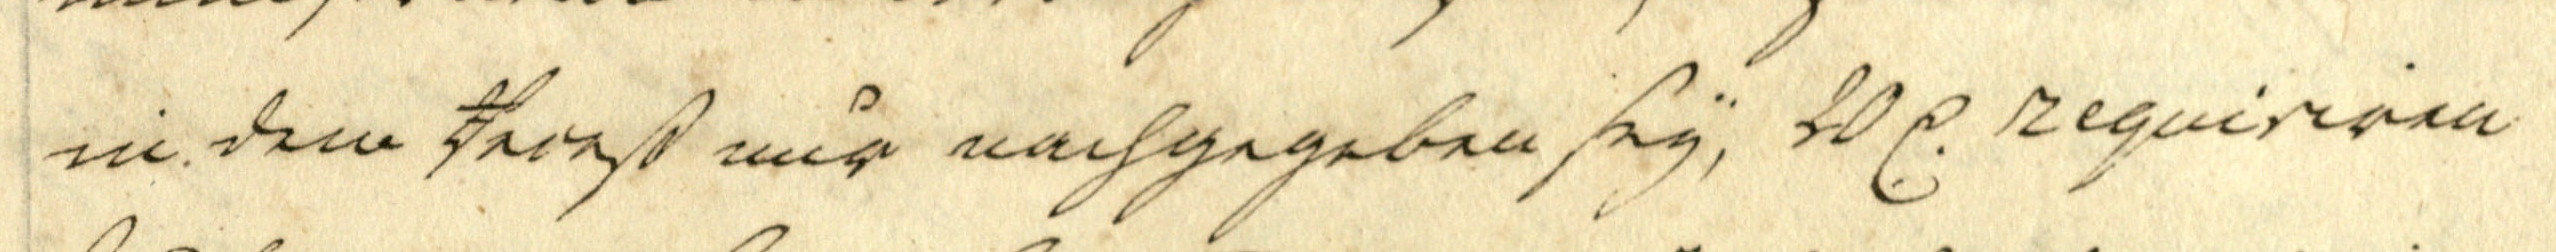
in dem Receß nur nachgegeben seÿ, 20 l. requiriren
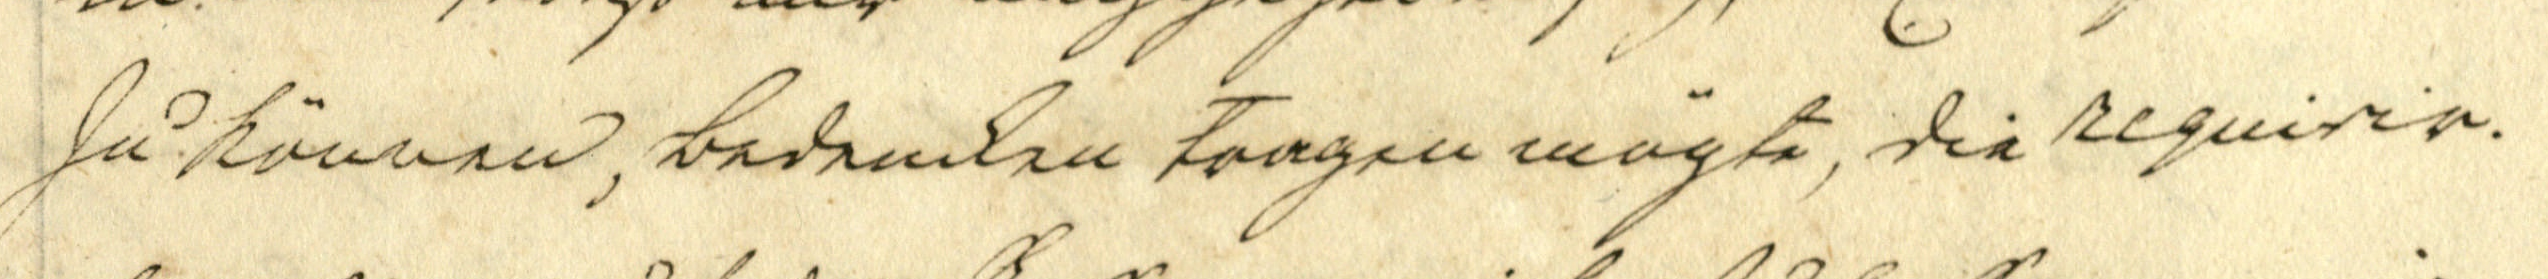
zu können, Bedenken tragen mögte, die requirir¬
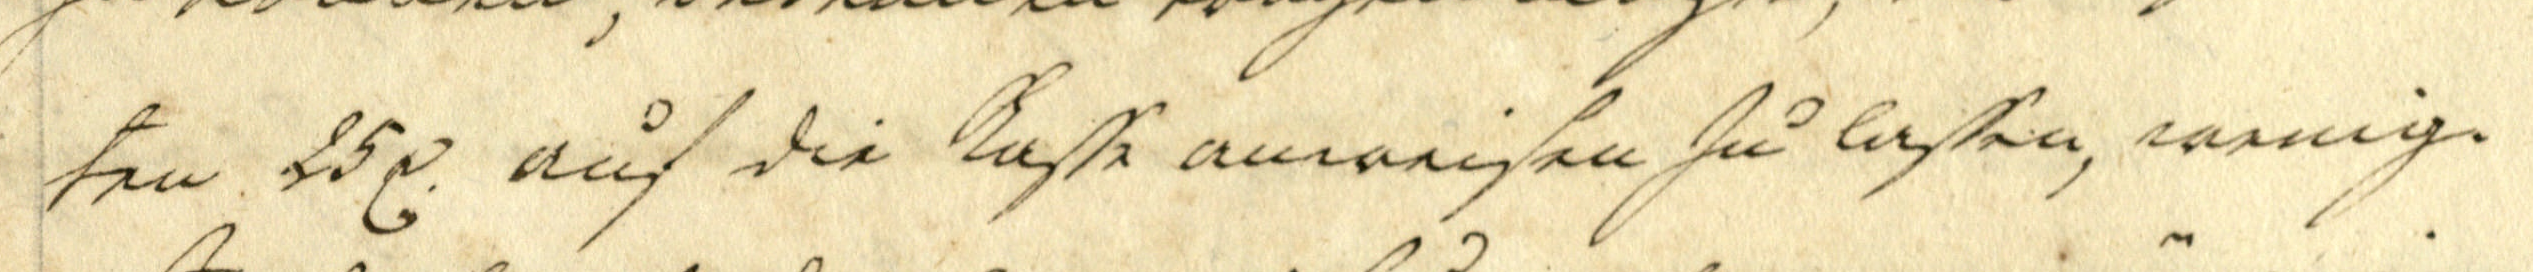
ten 25 l. auf die Kasse anweisen zu lassen, wenig¬
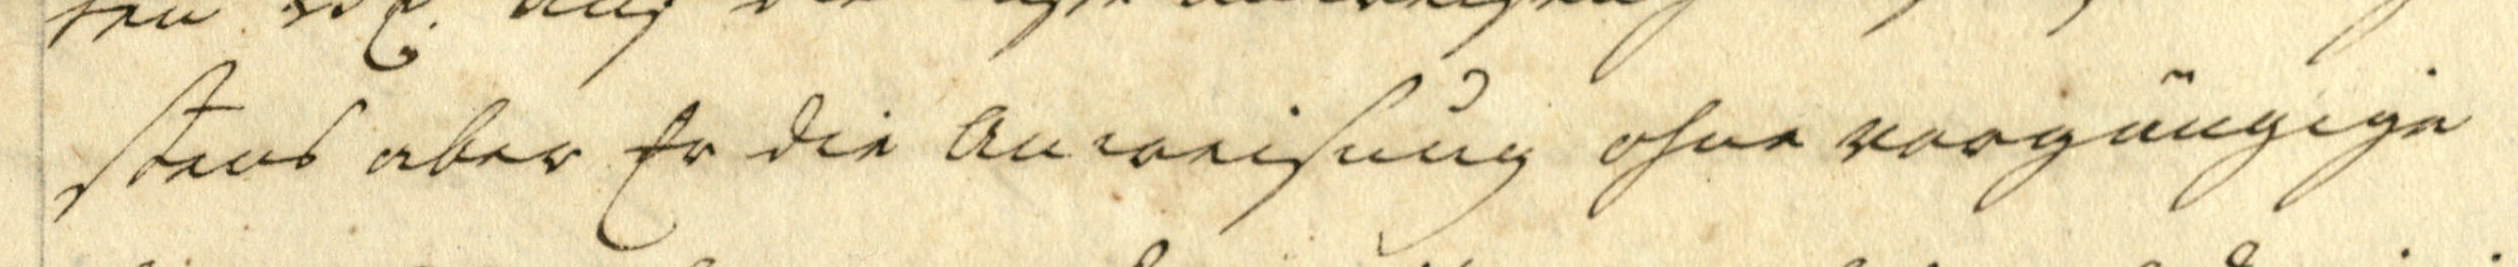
stens aber Er die An weisung ohne vorgängige
